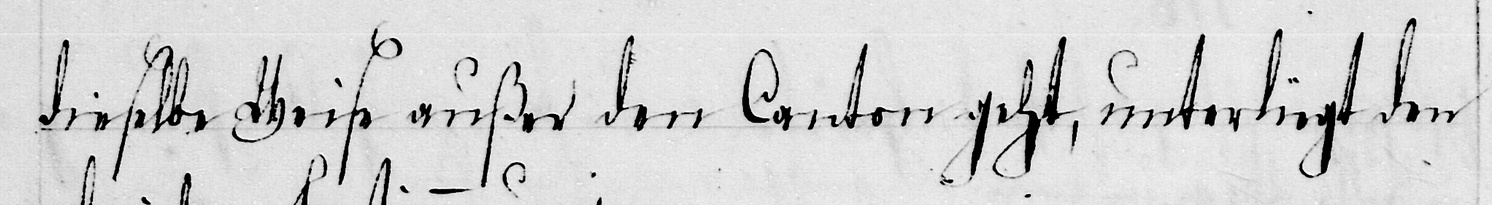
dieselbe Weise außer den Canton geht, unterliegt den
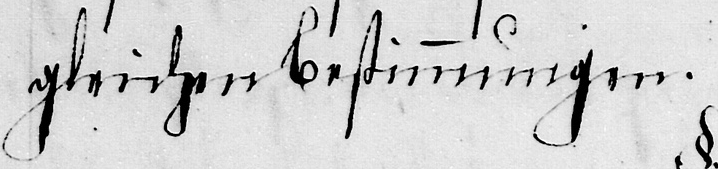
gleichen Bestimmungen.
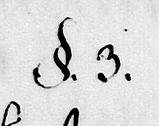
§. 3.
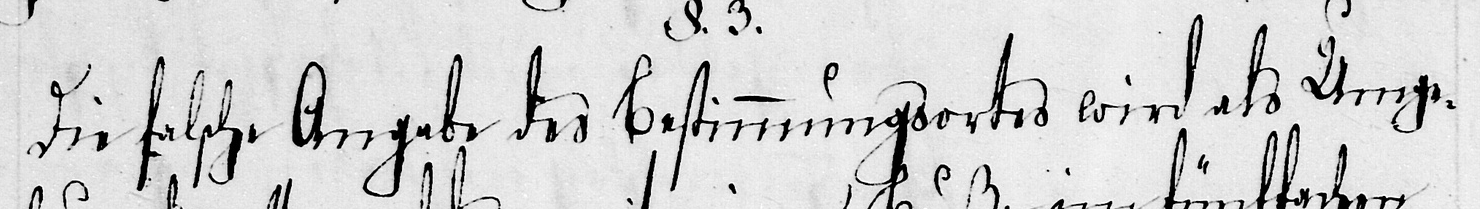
Die falsche Angabe des Bestimmungsortes wird als Umge¬
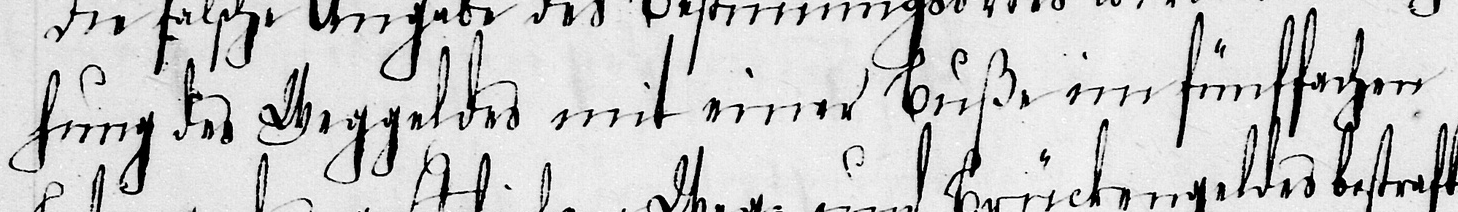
hung des Weggeldes mit einer Buße im fünffachen
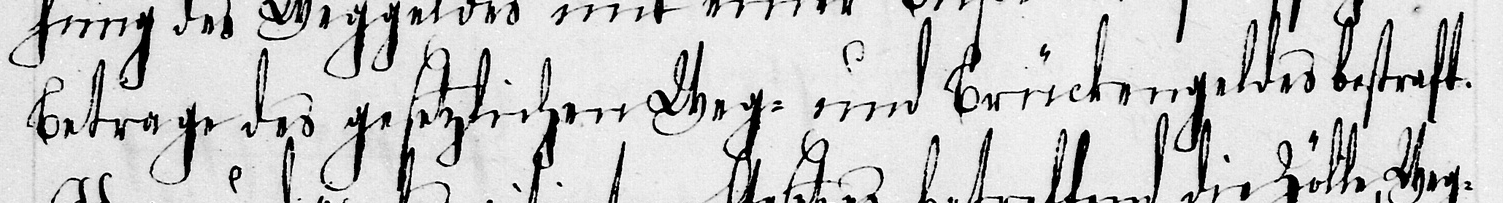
Betrage des gesetzlichen Weg- und Brückengeldes bestraft.
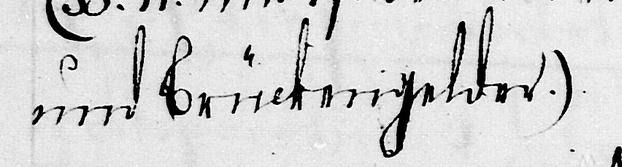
und Brückengelder.)
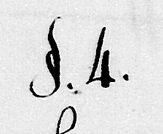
§. 4.
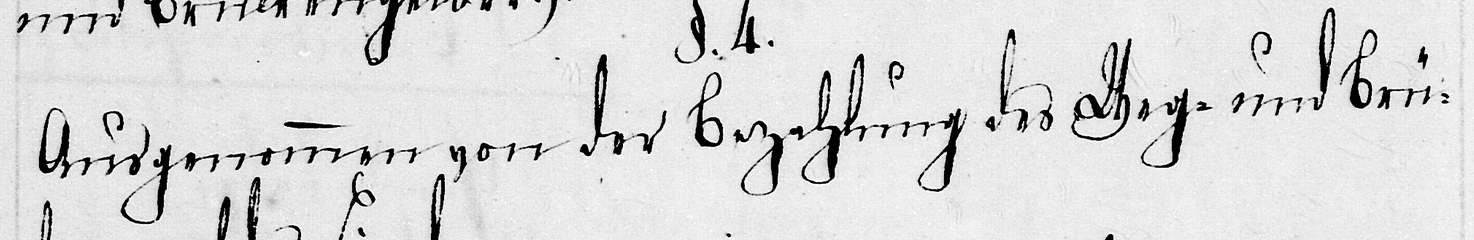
Ausgenommen von der Bezahlung des Weg- und Brü¬
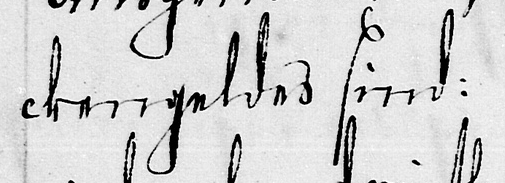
ckengeldes sind:
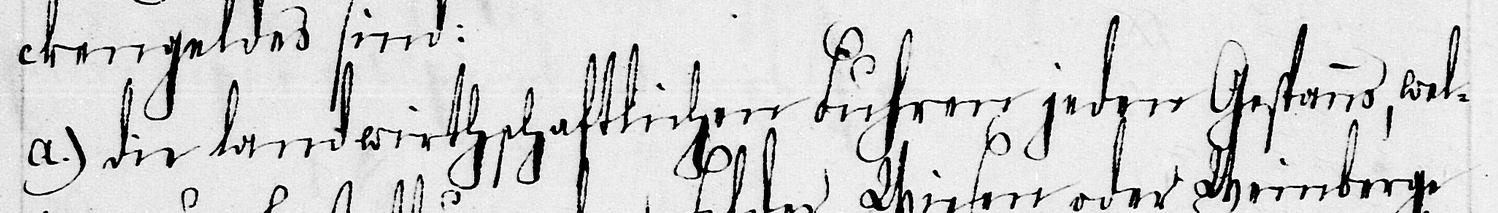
a.) die landwirthschaftlichen Fuhren jeden Gespanns, we¬
